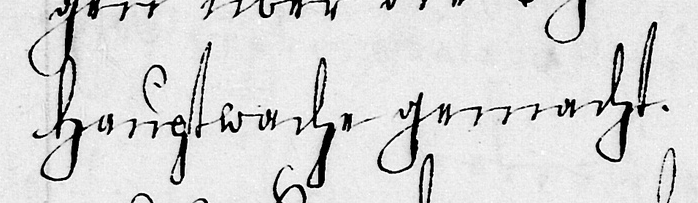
Hauptwache gemacht.
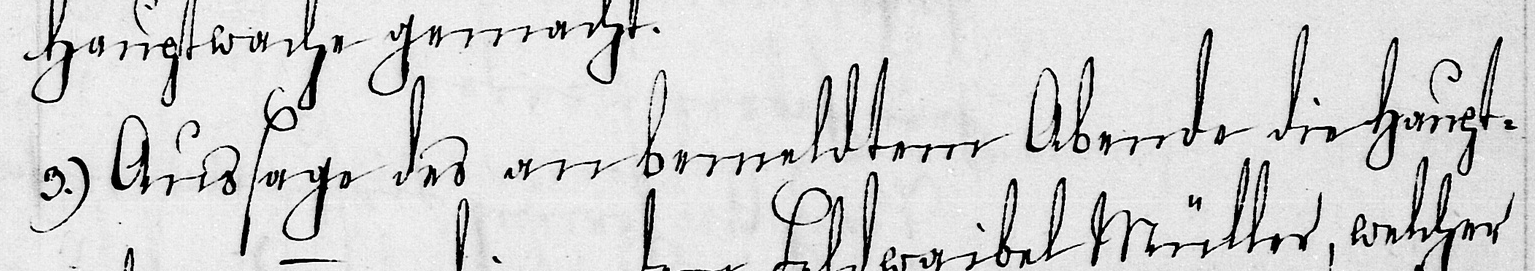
3.) Aussage des an bemeldtem Abende die Haupt¬
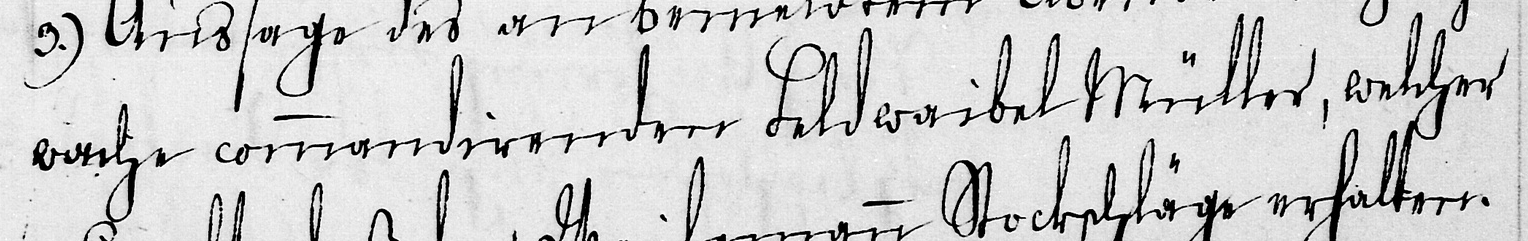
wache commandirenden Feldwaibel Müller, welcher
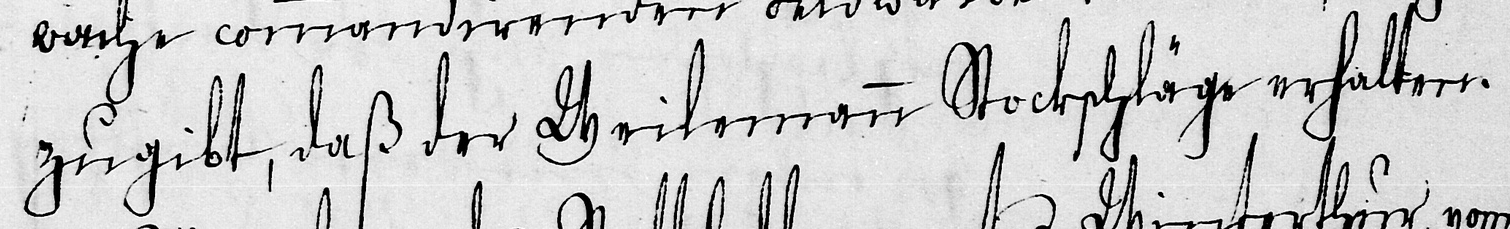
zugibt, daß der Weilemann Stockschläge erhalten.
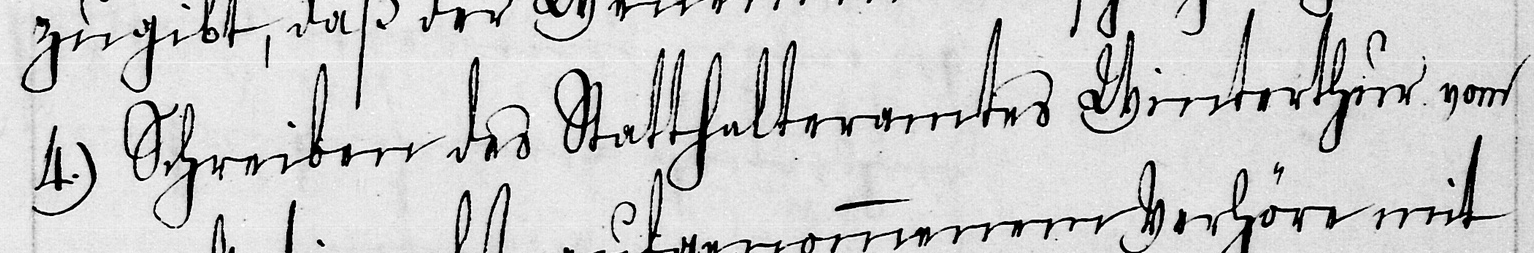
4.) Schreiben des Statthalteramtes Winterthur vom
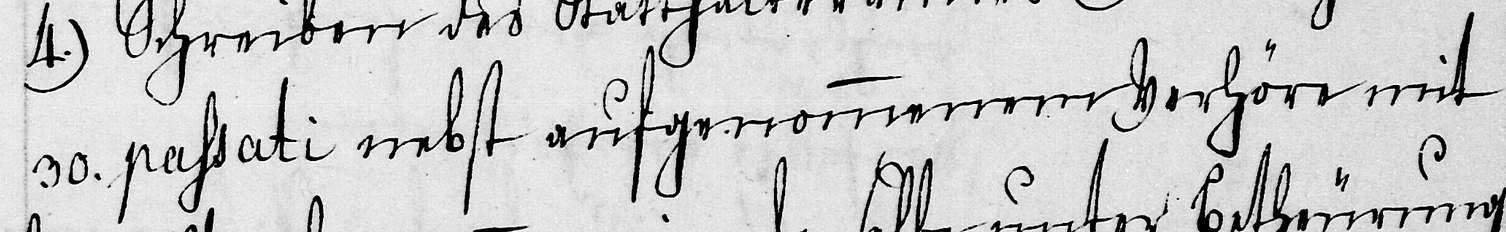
30. passati nebst aufgenommenem Verhöre mit
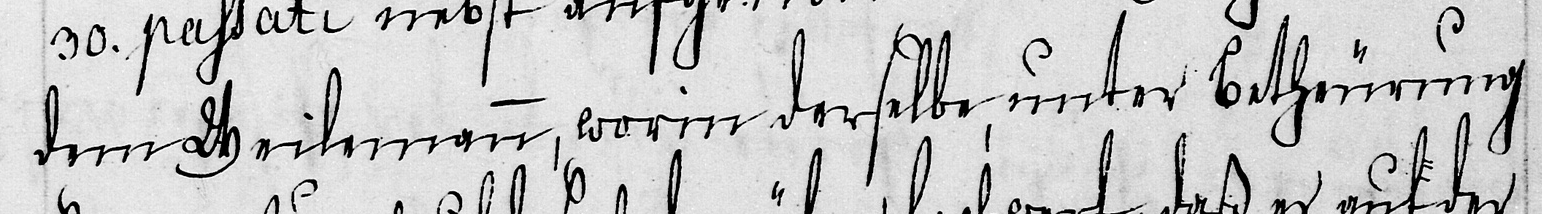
dem Weilemann, worin derselbe unter Betheurung
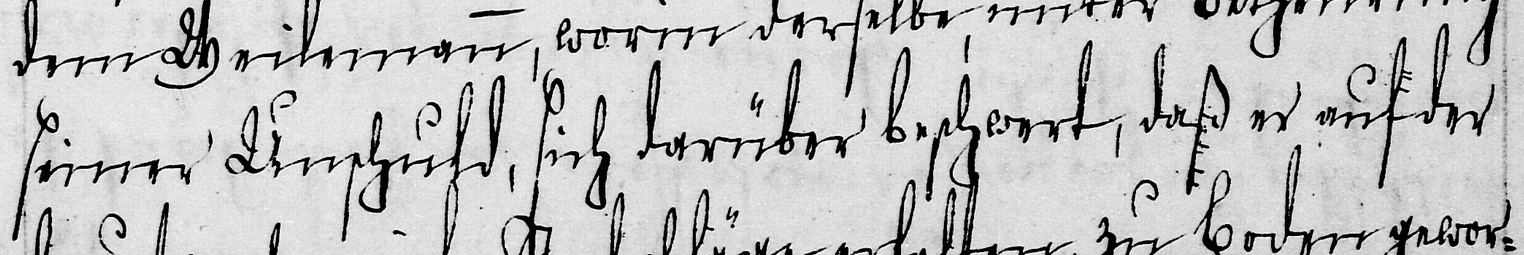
seiner Unschuld, sich darüber beschwert, daß er auf der
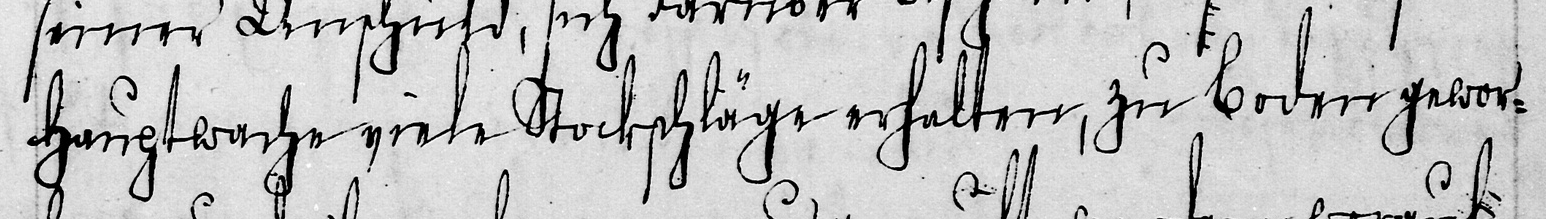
Hauptwache viele Stockschläge erhalten, zu Boden gewor¬
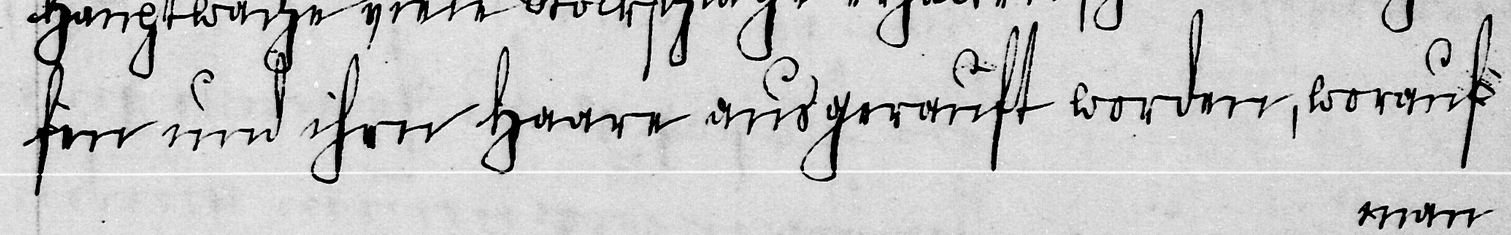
fen und ihm Haare ausgerauft worden, worauf
